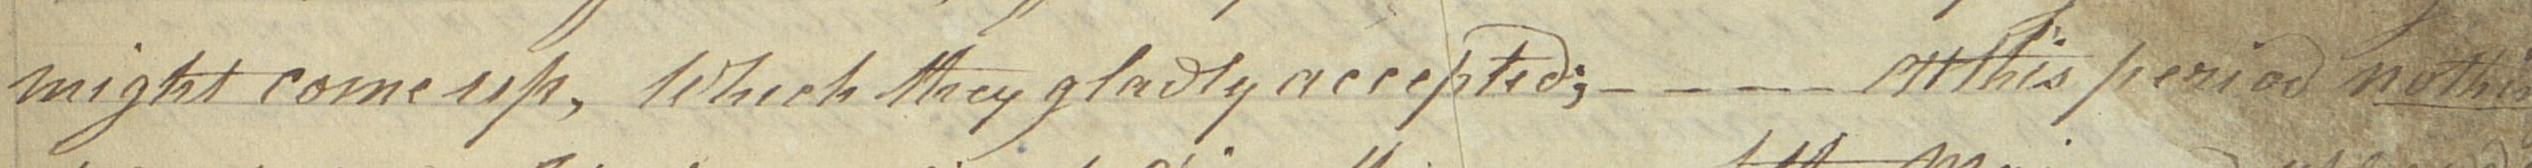might come up, which they gladly accepted; at this period nothing
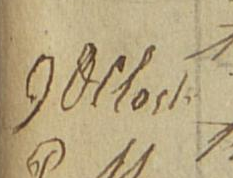9 OClock
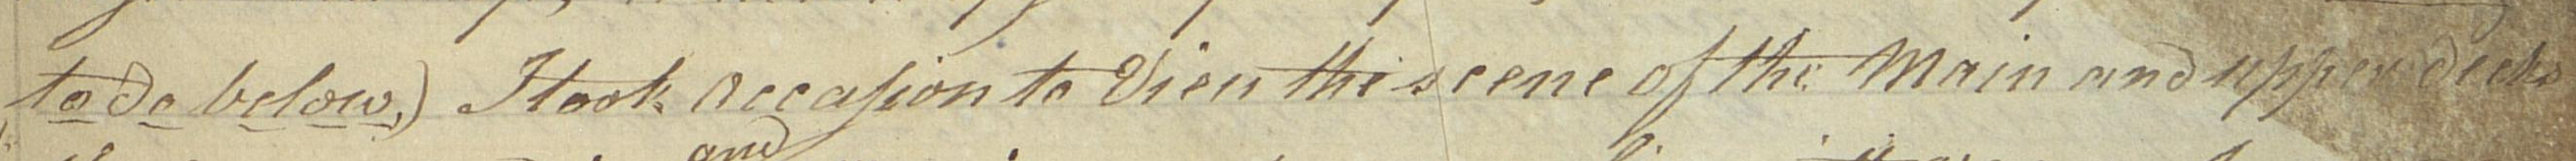to do below) I took occasion to Vien the scene of the main and upper deck
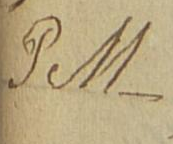PM
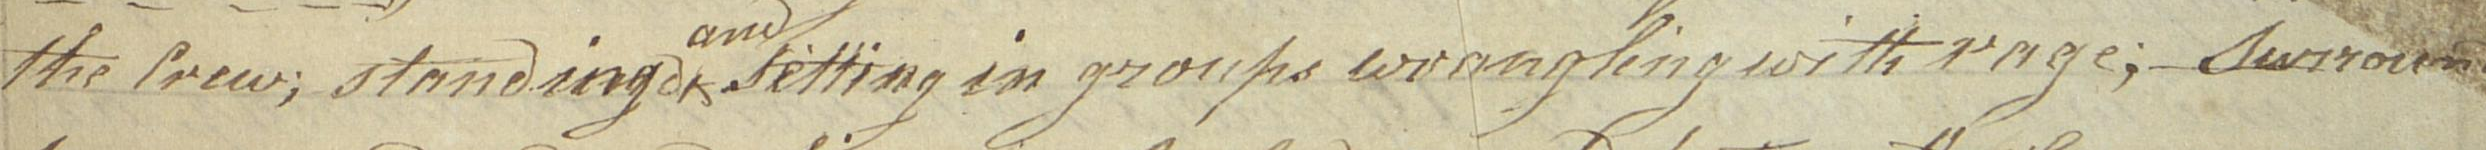the Crew; standing ^ Setting in groups wrangling with rage; Surround
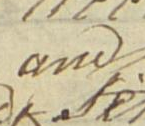and
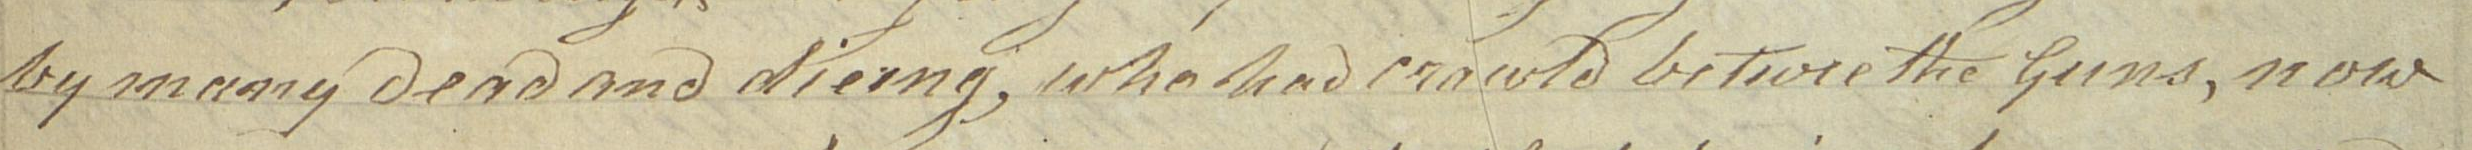by many dead and dieing, who had crawld betwee the Guns, now
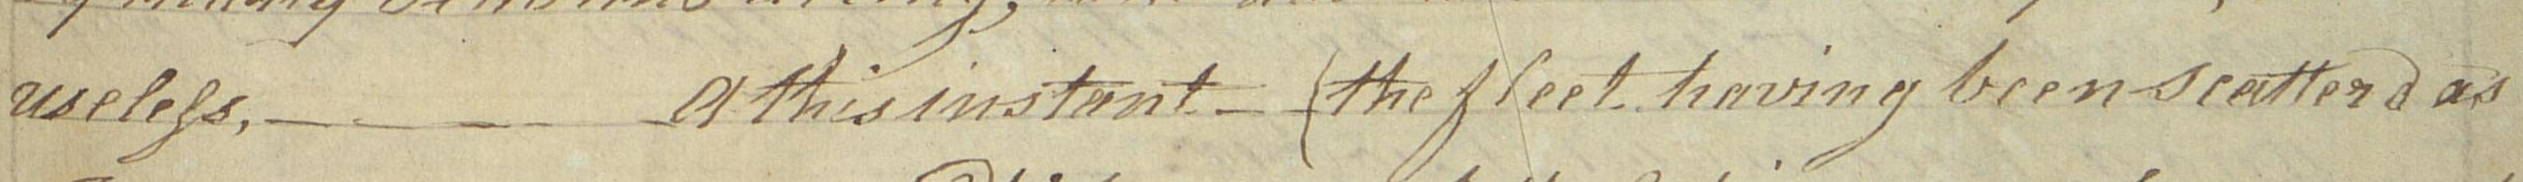useless, A this instant (the fleet having been scatterd as
